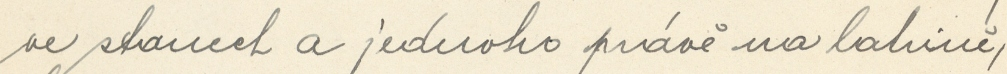ve stanech a jednoho právě na latrině,
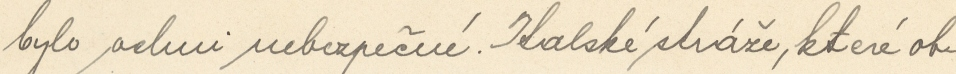bylo velmi nebezpečné. Italské stráže, které ob-
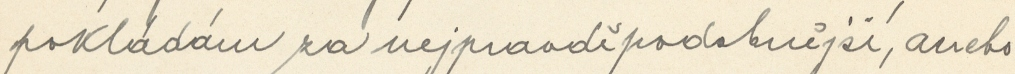pokládám za nejpravděpodobnější, anebo
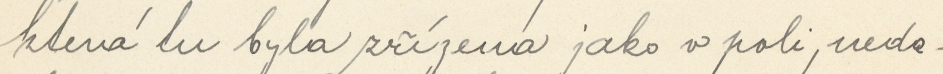která tu byla zřízena jako v poli, neda-
